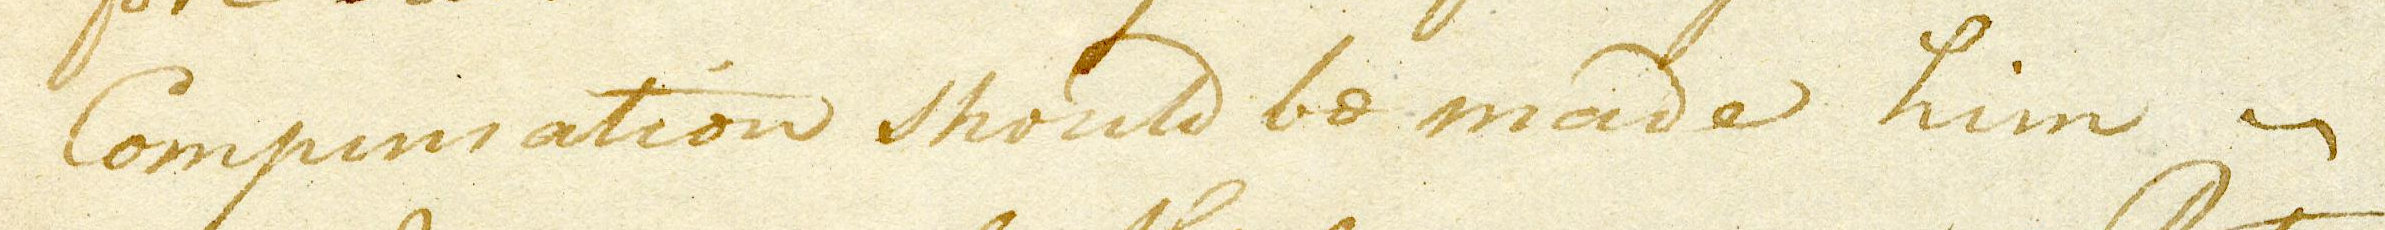Compensation should be made him-
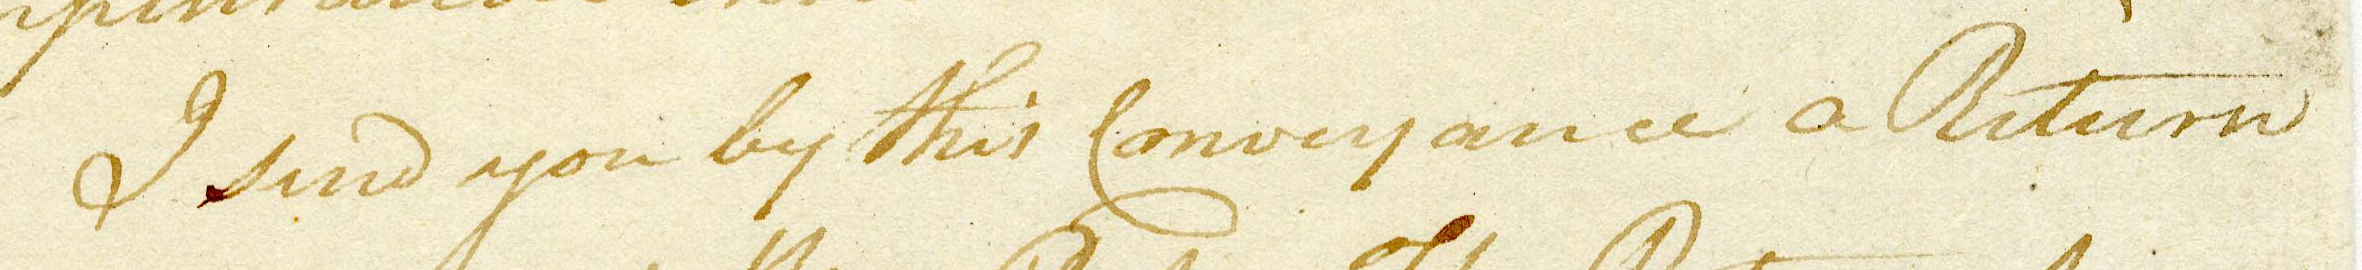I send you by this Conveyance a Return
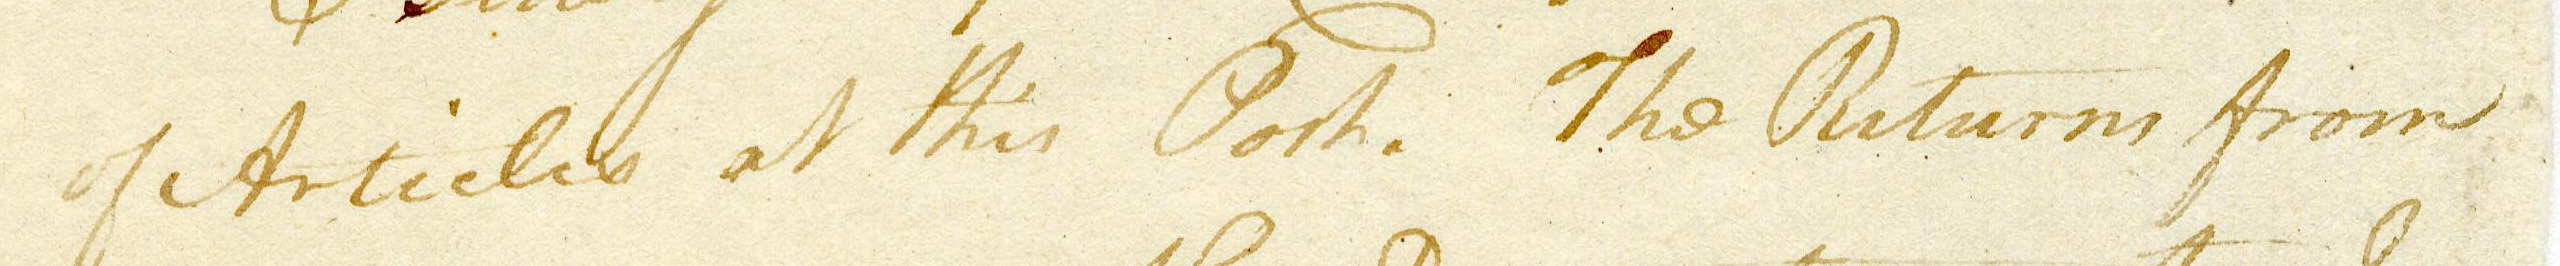of Articles at this Post. The Return from
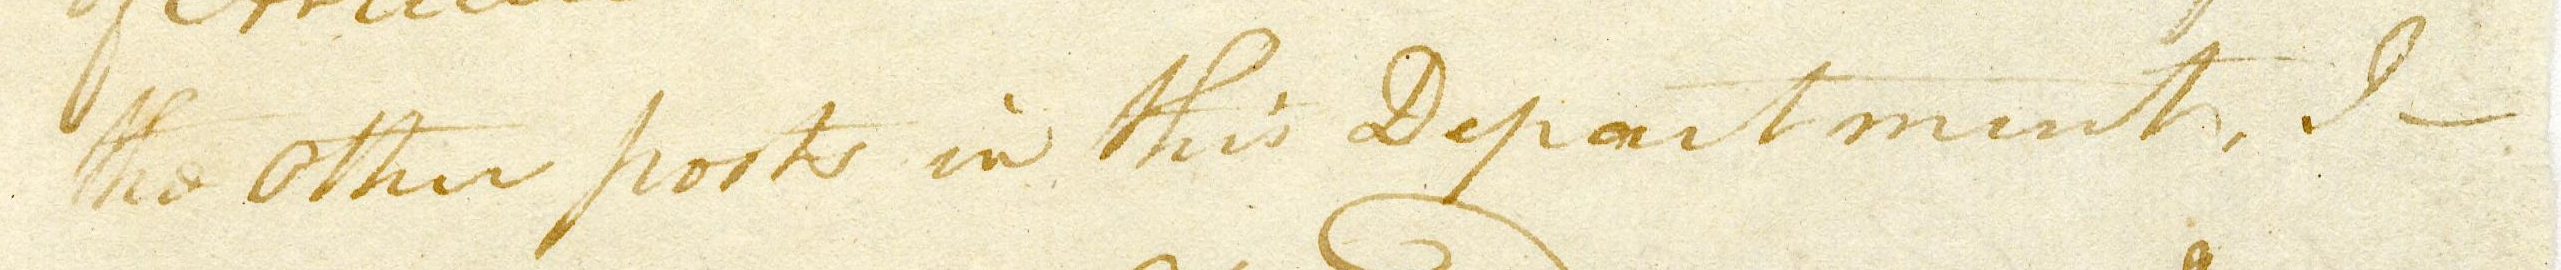the other posts in this Department, I-
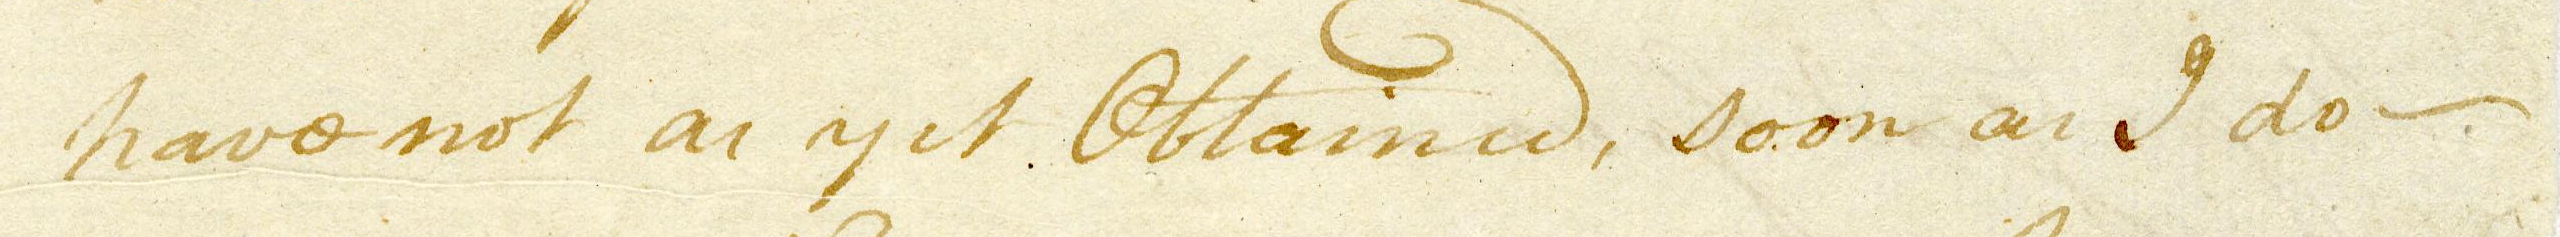have not as yet Obtained, soon as I do-
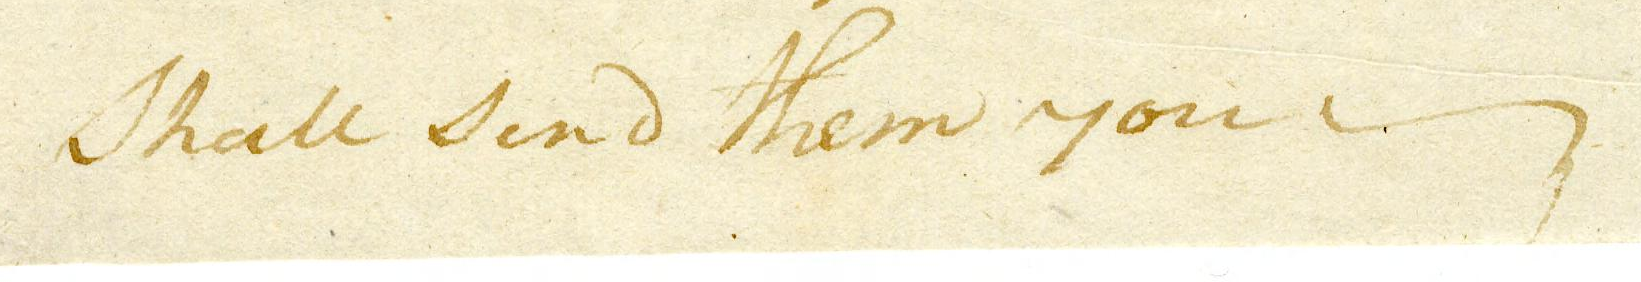Shall send them you-
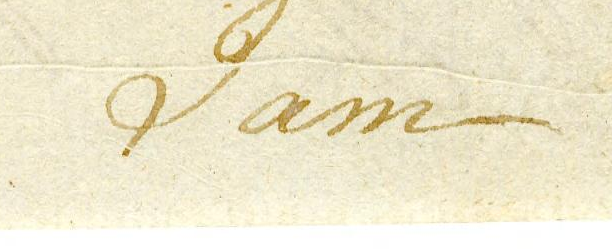I am
